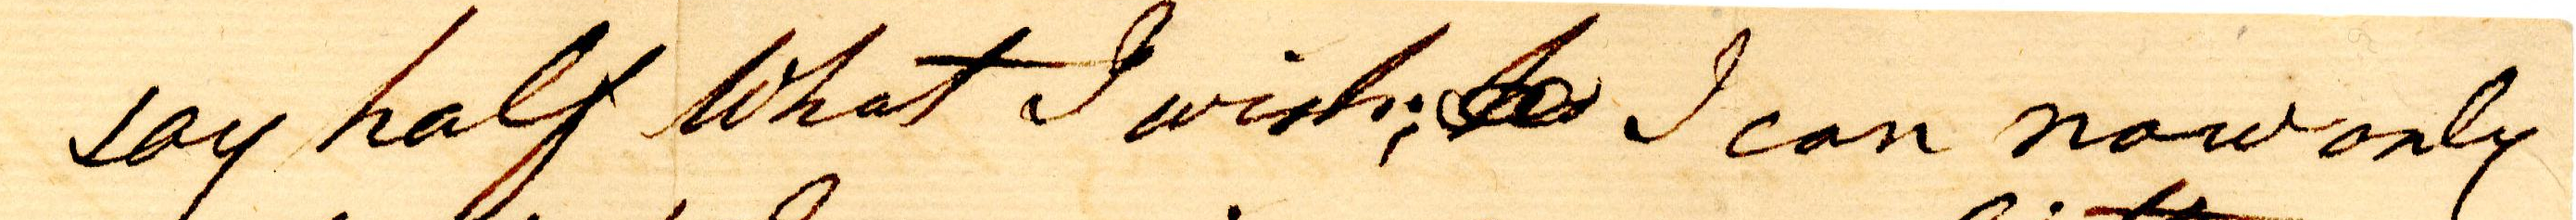say half What I wish; [__] I can now only
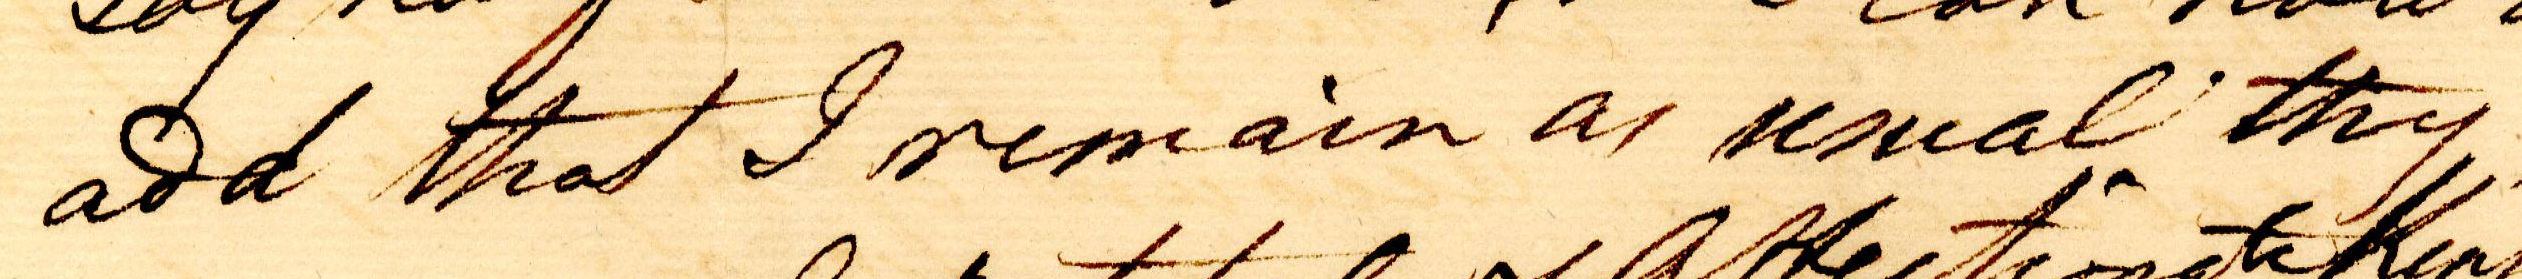add that I remain as usual thy
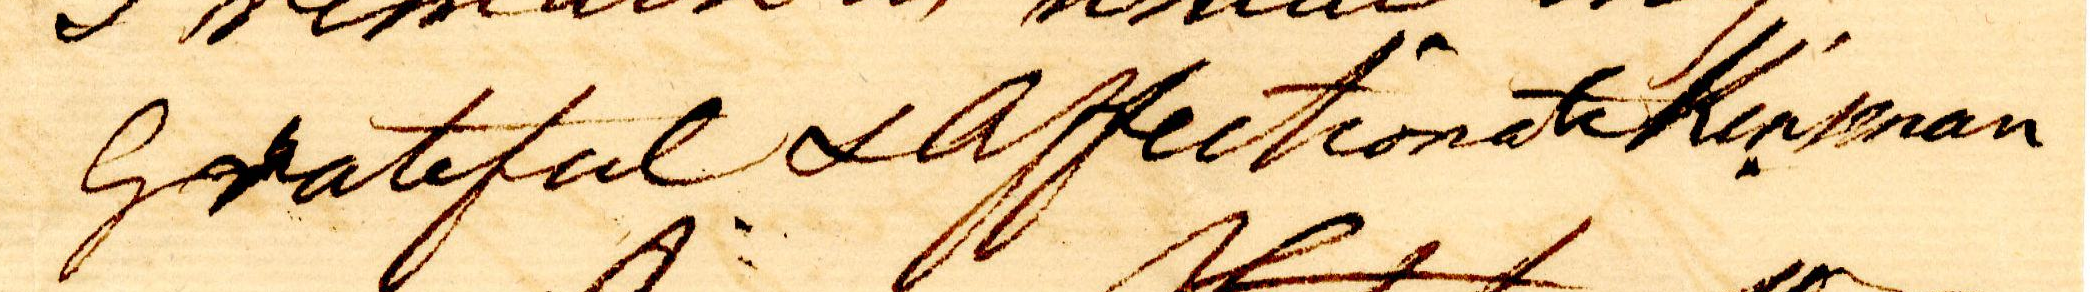Grateful & affectionate Kinsman
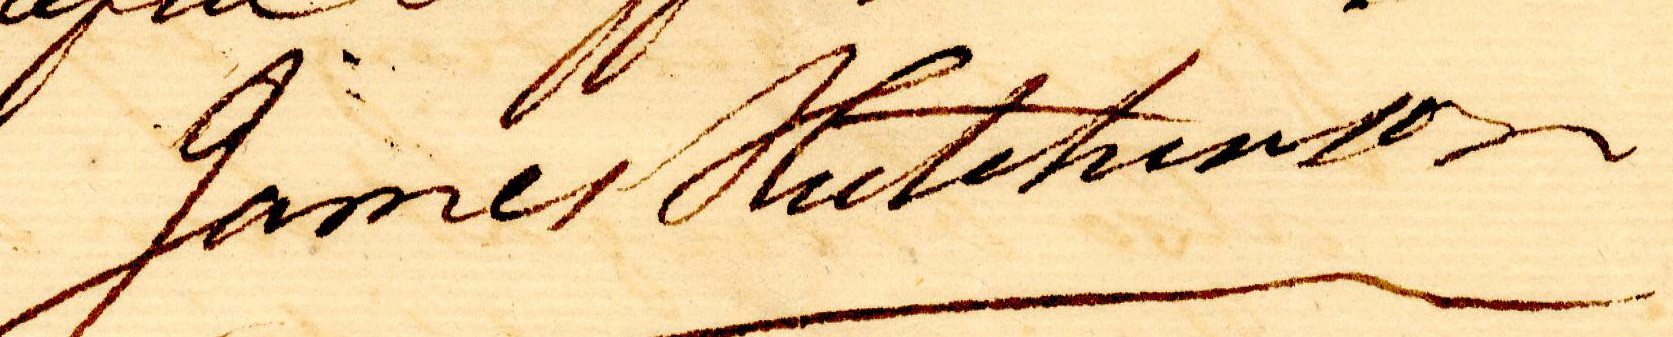James Hutchinson
